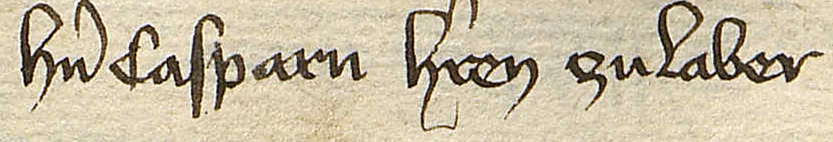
hn* Caſparn h*ren cʒu Laber
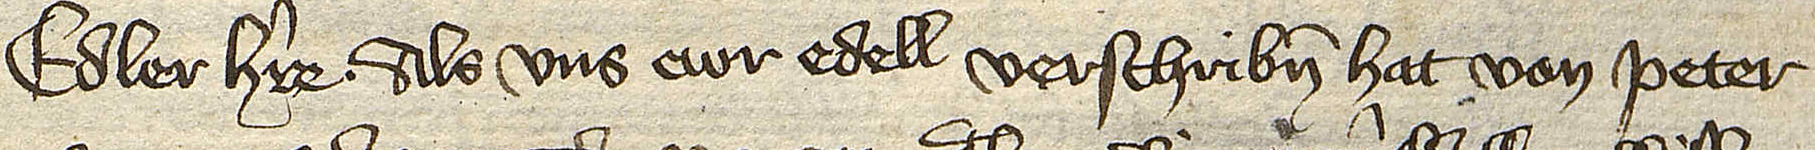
Edler h*re . Als vns ewr edell verſchribn* hat von Peter
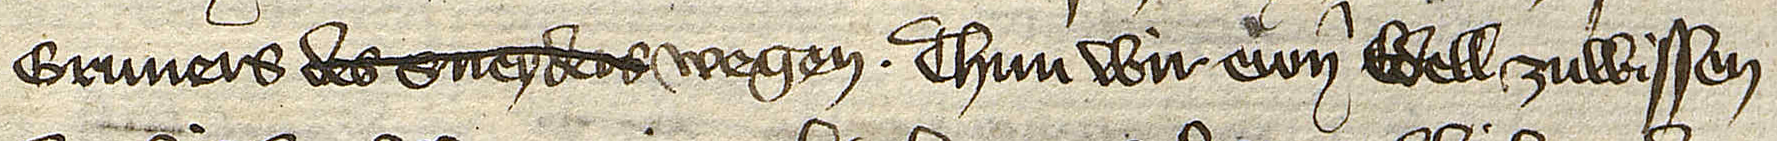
Gruners des Sneyders wegen . Thun wir ewn* Edell cʒuwiſſen
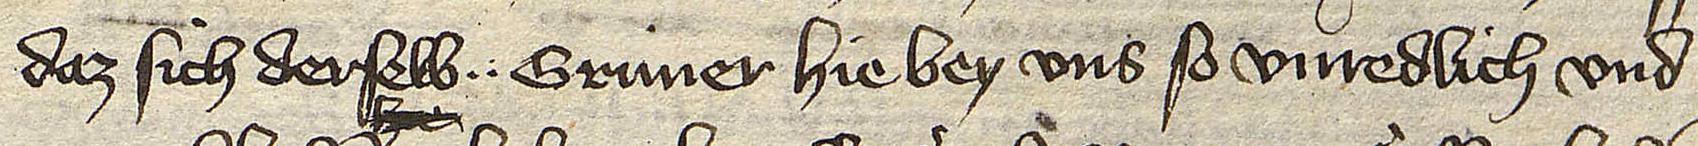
daʒ ſich derſelb ~ Grüner hie bey vns ſo vnredlich vnd
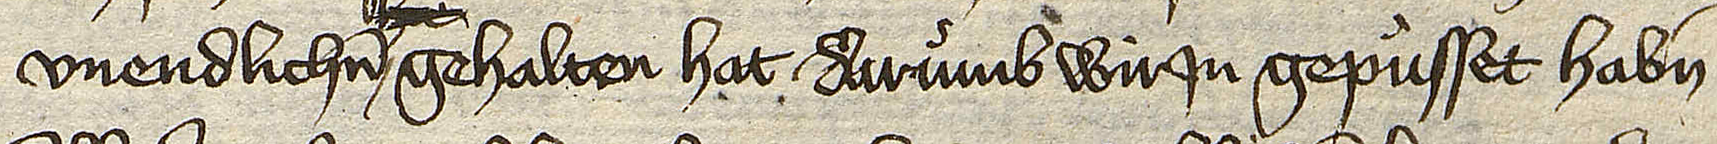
vnendlichn* gehalten hat / darümb wir In gepüſſet habn*
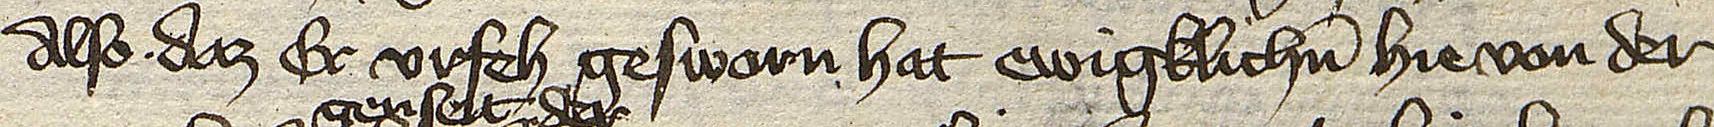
Alſo . daʒ Er vrfeh geſworn hat ewigklichn* hie von der
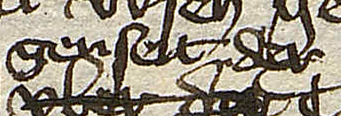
genſeit der
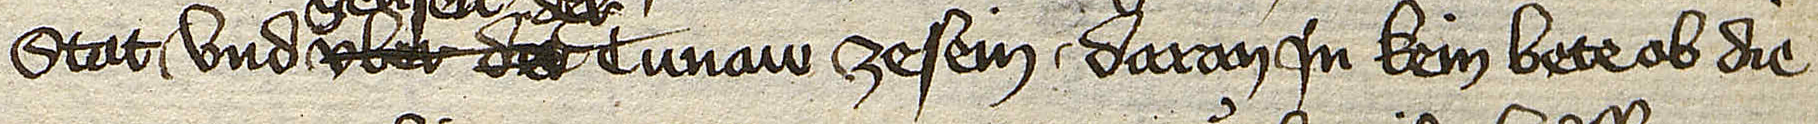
Stat / vnd vber der Tunaw cʒeſein / daran In kein bete ob die
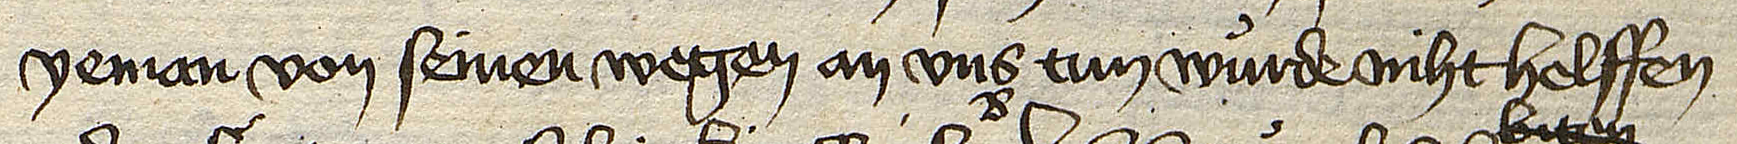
yeman von ſeinen wegen an vns tun würde niht helffen
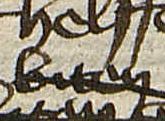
biten
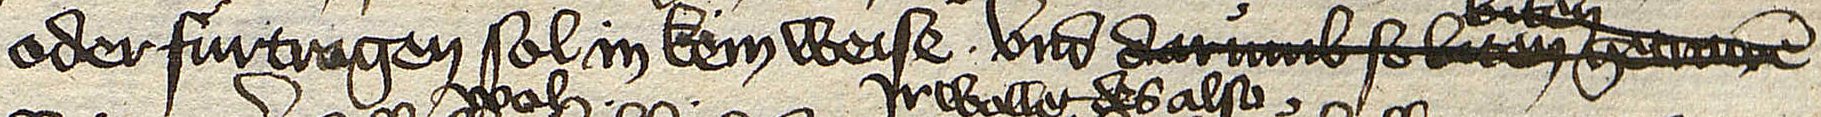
oder fürtragen ſol in kein weiſe . Vnd darümb ſo biten getrawe*
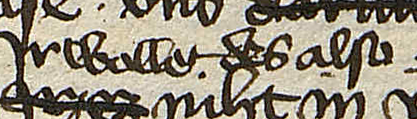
Ir wollet des alſo
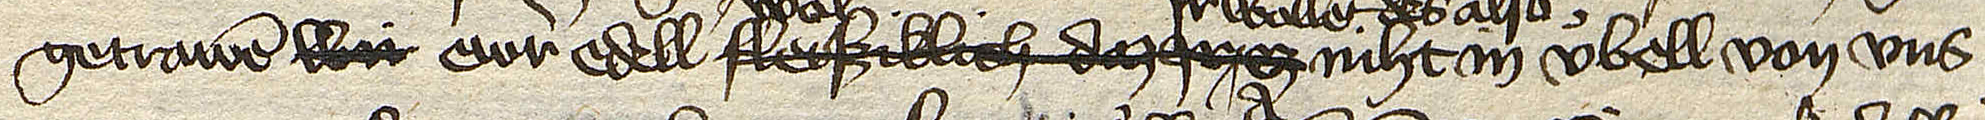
getrawe* wir ewr* edell fleiſʒiklich daʒ Ir eʒ niht in v̈bell von vns
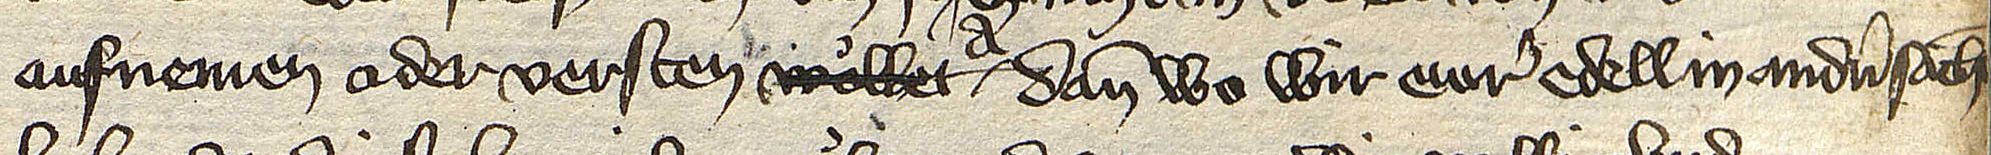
aufnemen oder verſten wöllet / Dan* wo wir ewr* edellin andn* ſachn*
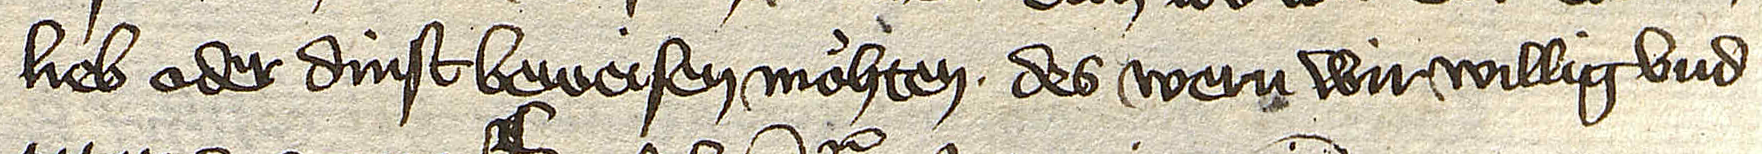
lieb oder dinſt beweiſen möhten . des wern wir willig vnd
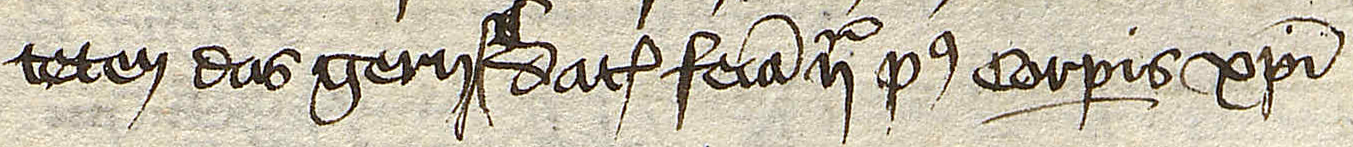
teten das gern / Dat* feia* ii* p* Corp*is xpi*
